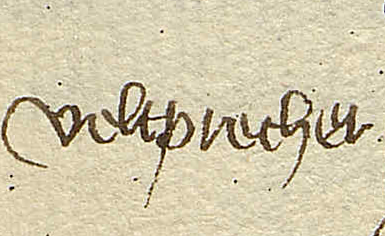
veltprecher
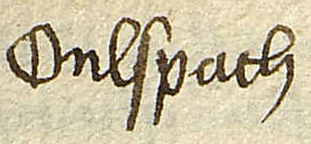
Onlſpach
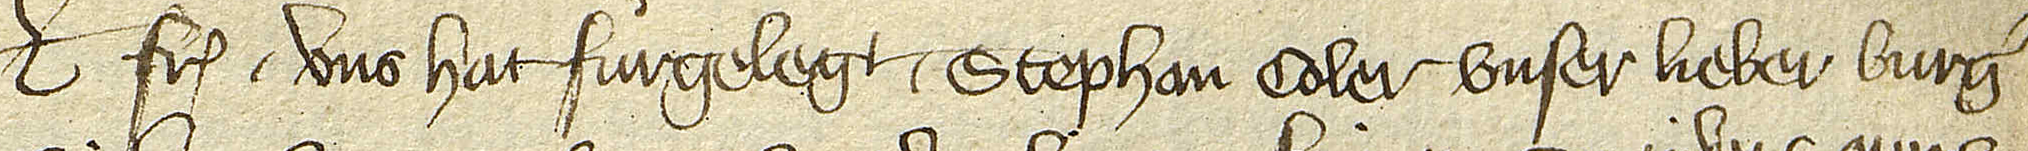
L* fr* / Vns hat fürgelegt / Stephan Coler vnſer lieber burg*
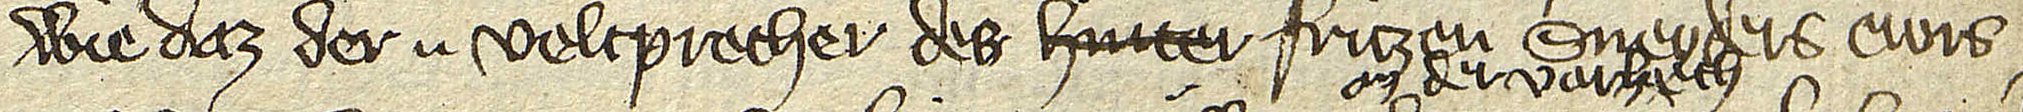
wie daʒ der ~ veltprecher des hütter fricʒen Sneyders ewrs*
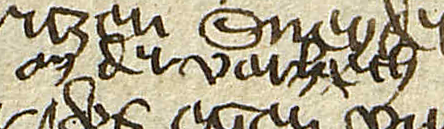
an der var%%%%
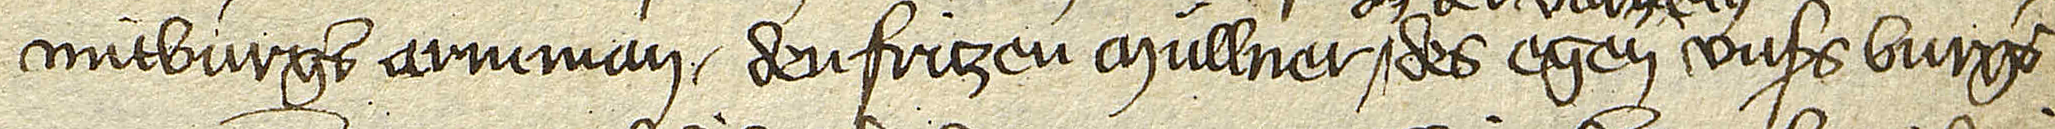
mitburgs* armman / den fricʒen Müllner des egen vnſ*s burgs*
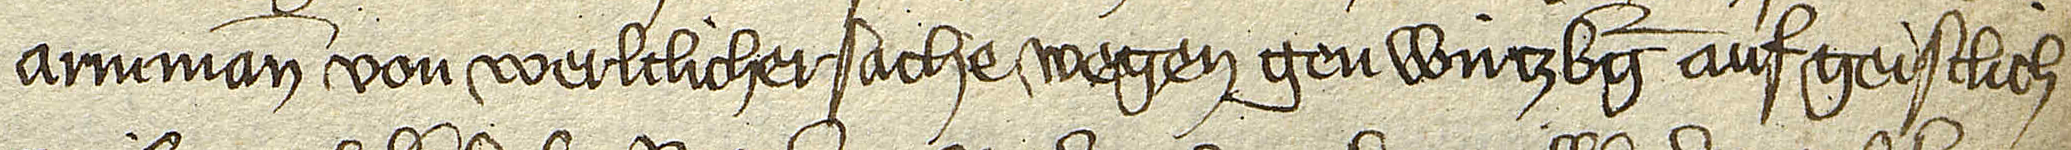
armman von werltlicher ſache wegen gen wircʒb*g auf geiſtlich
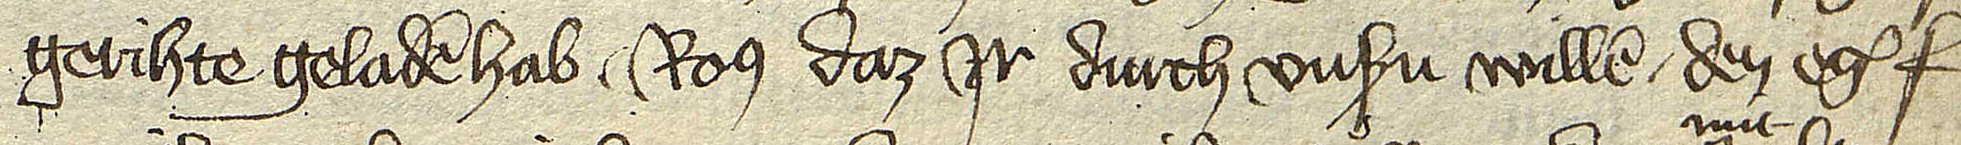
gerihte gelad* hab / Ro* daʒ Ir durch vnſ*n wille / den eg* f
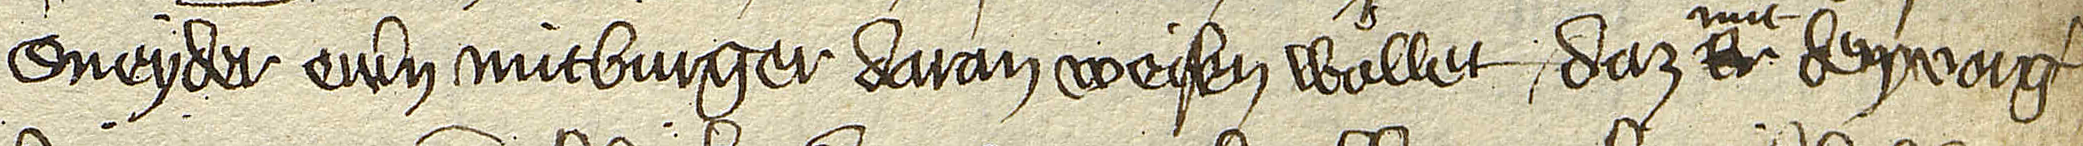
Sneyder ew*n mitburger daran weiſen wöllet / daʒ Er den vorg*
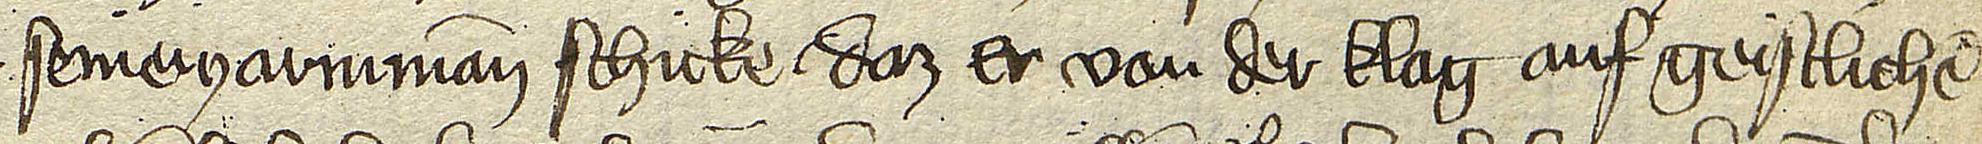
ſeinen armman* ſchicke / daʒ er von der klag auf geiſtliche*
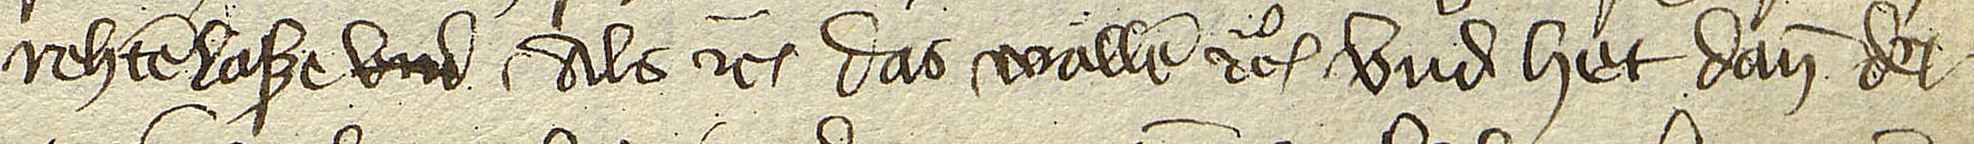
rehte* laſʒe vnd / Als ec* das wölle ec* / vnd het dan* der
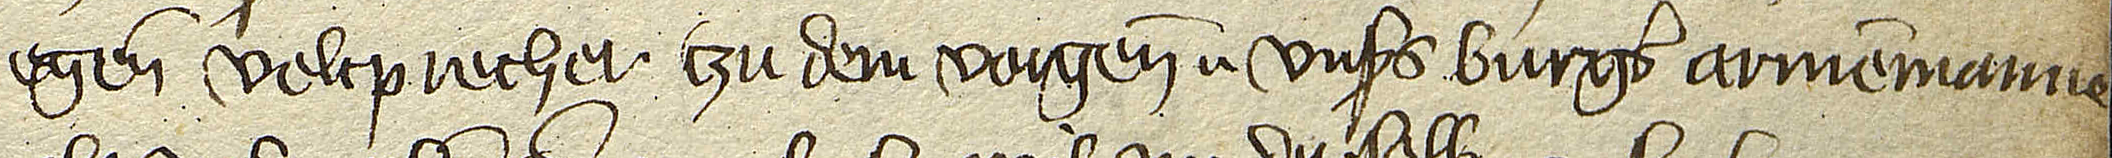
egen* veltprecher cʒu dem vorgen* ~ vnſ*s burg* arme*manne
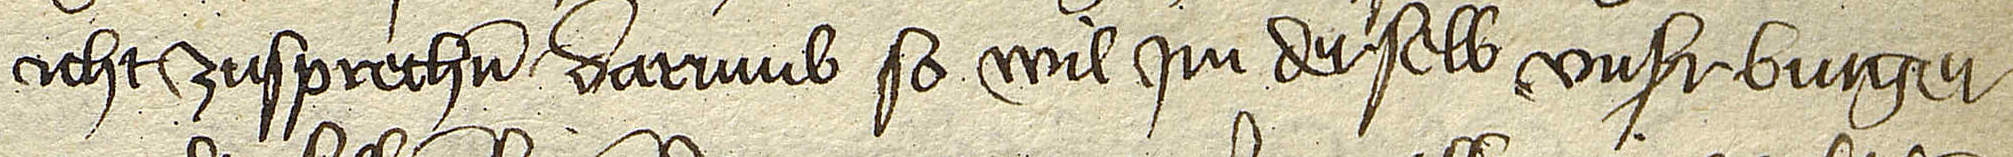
icht cʒuſprechn* / darumb ſo wil Im derſelb vnſ*r burger
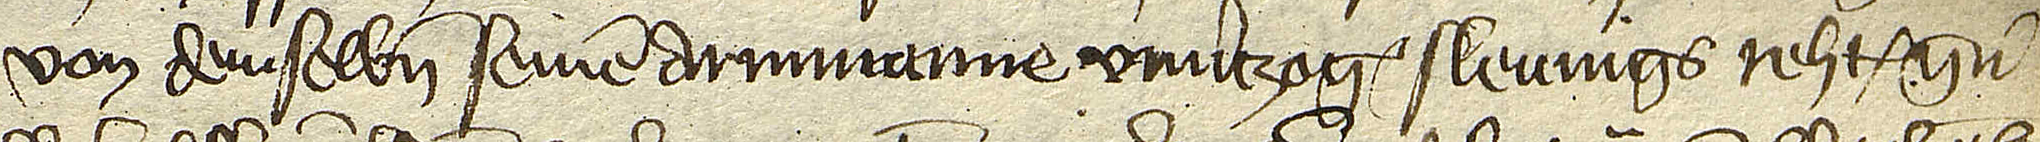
von demſelbn* ſeine* Armmanne vnu*cʒog* ſleunigs reht* gn*
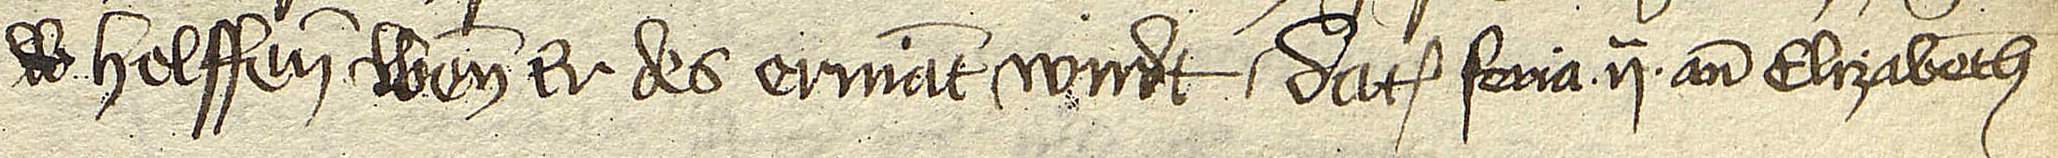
w helffen* / wen* Er des ermat* wirdt / dat* feria . ii* . an* Eliʒabeth*
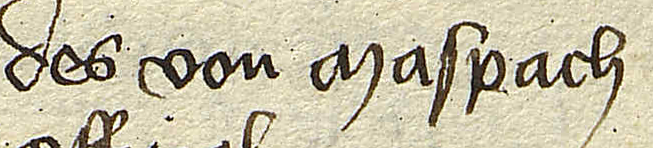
des von Maſpach
